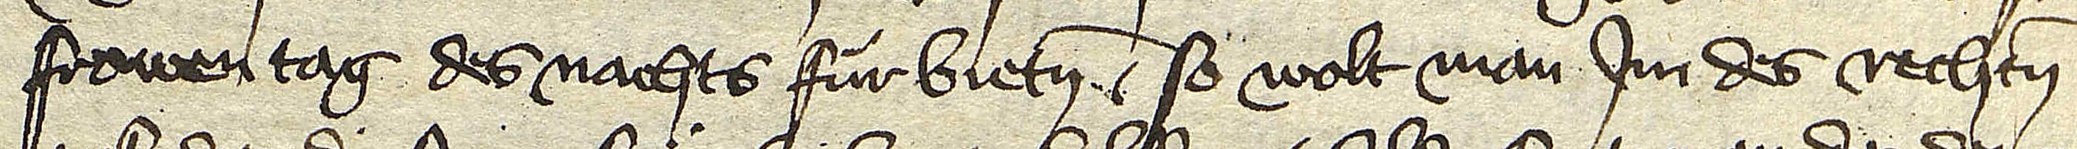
frawen tag des nachts fürbietn* / ſo wolt man Im des rechtn*
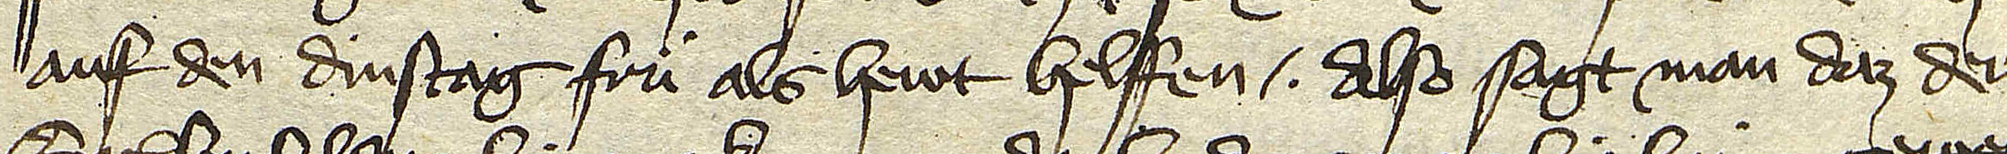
auf den dinſtag frü als hewt helffen / . Alſo ſagt man daʒ der
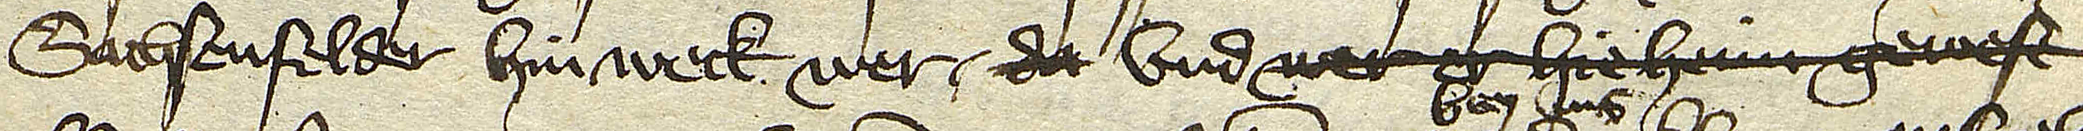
Sachſenfelder hin weck wer / da vnd wer er hie heim geweſe*
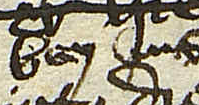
bey vns
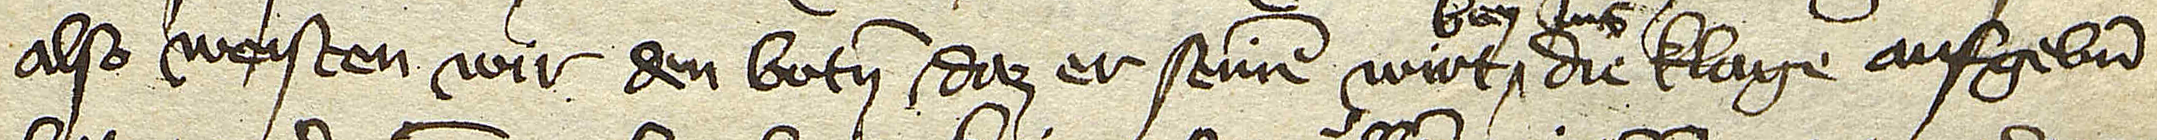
alſo weiſten wir den botn* / daʒ er ſeine* wirt / die klage aufgebn*
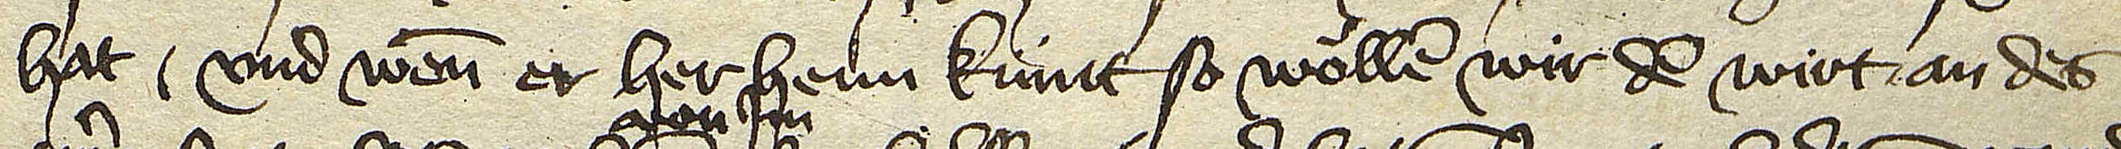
hat / vnd wen* er herheim kümt ſo wölle* wir d* wirt / an des
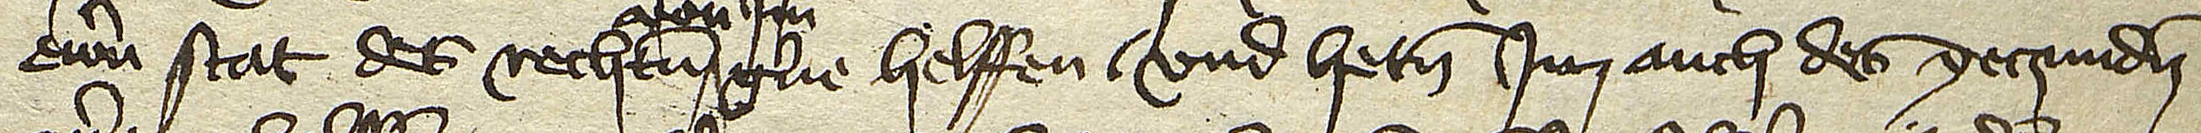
ewn* ſtat des rechtn* g*ne helffen / vnd hetn* Im auch des yecʒundn*
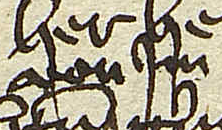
von Im
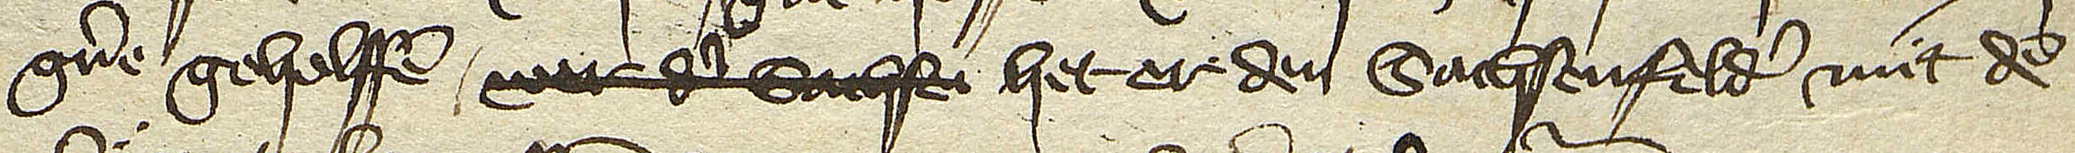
gn*e geholffe* / wer d* Sachſe het er den Sachſenfeld* mit d*
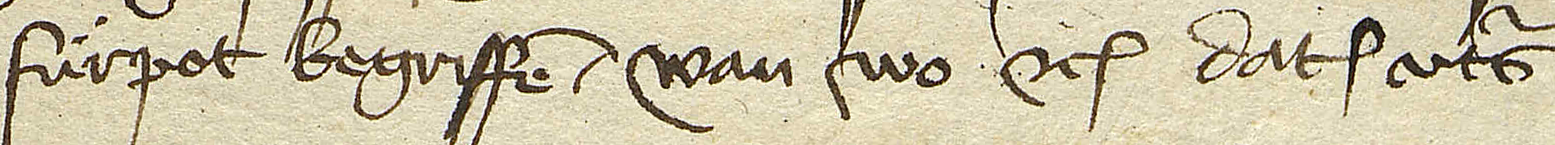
fürpot begriffe* / wan wo ec* dat* vts*
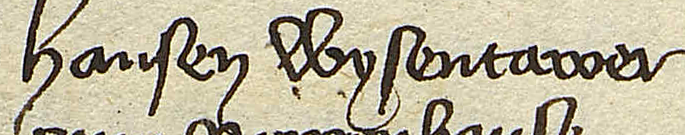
hanſen Wyſentawer
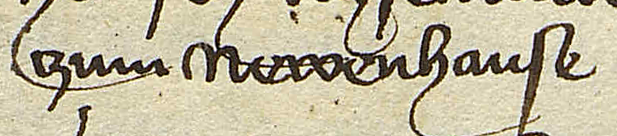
cʒum Newenhauſe
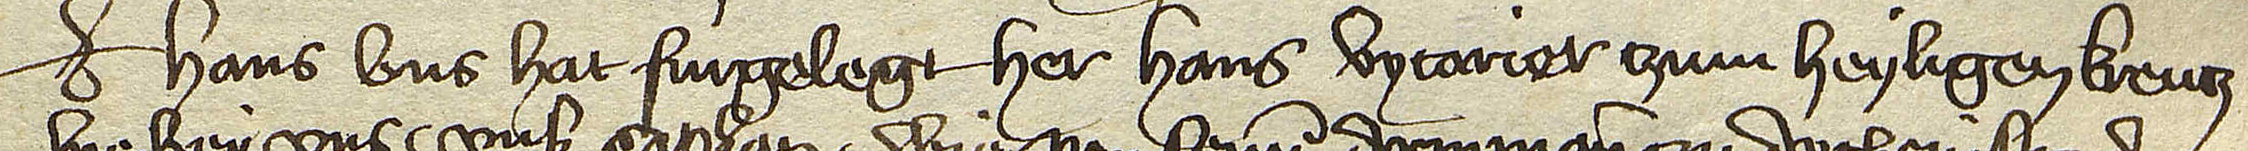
L* Hans vns hat fürgelegt her hans Vytarier cʒum heyligen kreucʒ
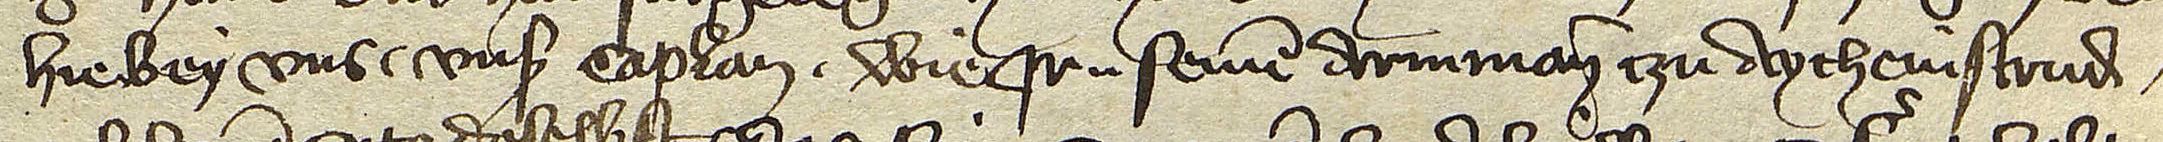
hiebey vns / vnſ* Caplan / wie Ir ~ ſeine* Armman* cʒu Aycheinſtrud
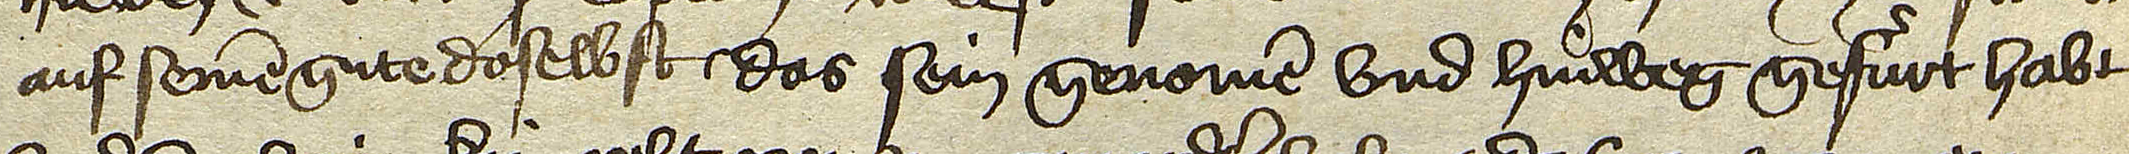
auf ſeine* gute doſelbſt / das ſein genome* vnd hinweg gefürt habt
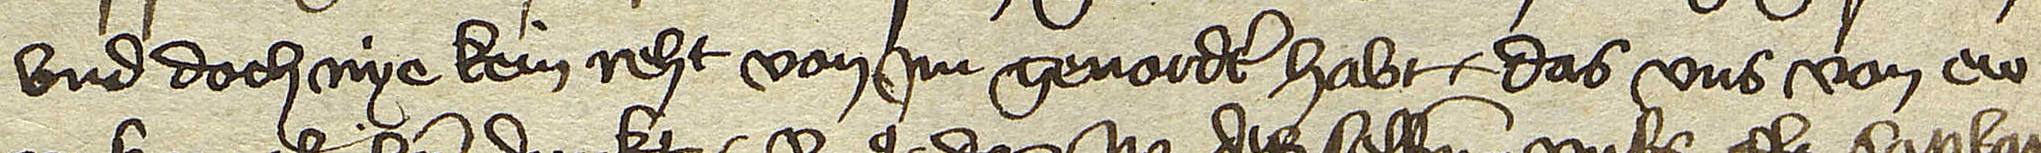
vnd doch nye kein reht von Im geuordt* habt / das vns von ew
